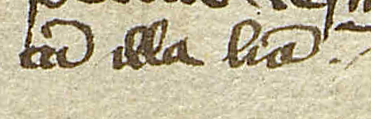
cu* illa li*a . /
